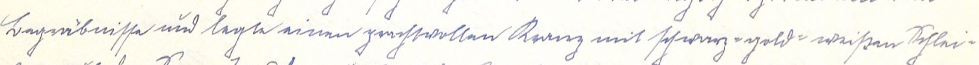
Begräbnisse und legte einen prachtvollen Kranz mit schwarz-gold-weißen Schlei-
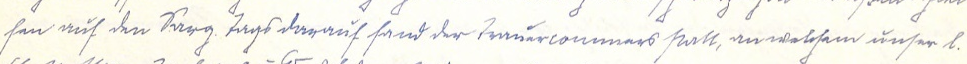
fen auf den Sarg. Tags darauf fand der Trauercommers statt, an welchem unser l.
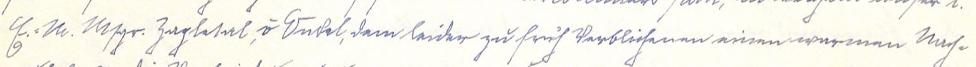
E.-M. Msgr. Zagletal, v/o Enkel, dem leider zu früh verblichenen einen warmen Nach-
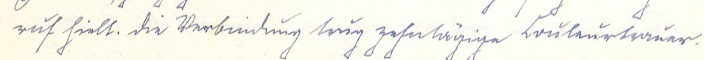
ruf hielt. Die Verbindung trug zehntätige Couleurtrauer.
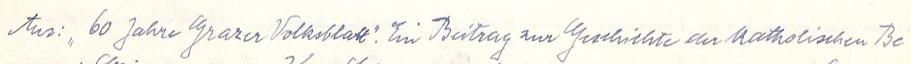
Aus: "60 Jahre Grazer Volksblatt". Ei Beitrag zur Geschichte der katholischen Be-
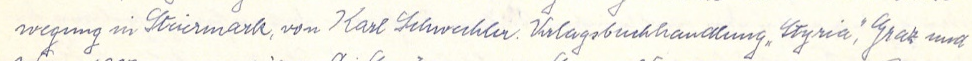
wegung in Steiermark, von Karl Schnachler. Verlagsbuchhandlung "Styria" Graz und
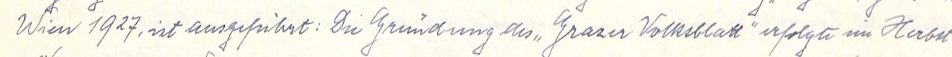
Wien 1927 ist ausgeführt: Die Grüdung des "Grazer Volksblatt" erfolge im Herbst
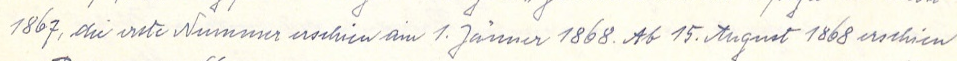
1867, die erste Nummer erschien am 1. Jänner 1868. Ab 15. August 1868 erschien
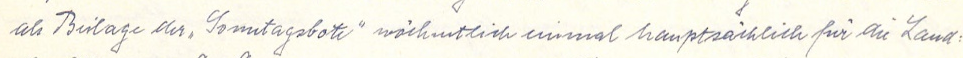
als Beilage der "Sonntagsbote" wöchentlich einmal hauptsächlich für die Land-
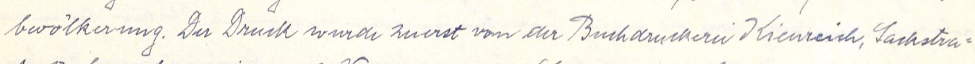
bevölkerung. Der Druck wurde zuerst von der Buchdruckerei Kienreich, Backstra-
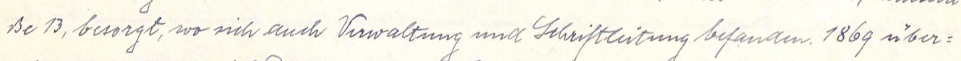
ße 13, besorgt, wo sich auch Verwaltung und Schriftleitung befanden. 1869 über-
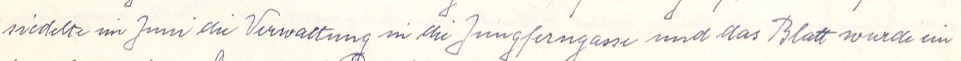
siedelte im Juni die Verwaltung in die Jungferngasse und das Blatt wurde ein
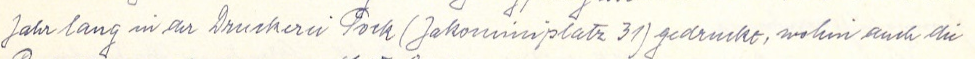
Jahr lang in der Druckerei Pock (Jakominiplatz 31) gedruckt, wohin auch die
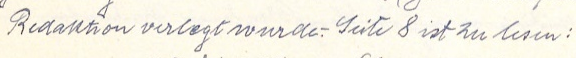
Redaktion verlegt wurde. - Seite 8 ist zu lesen:
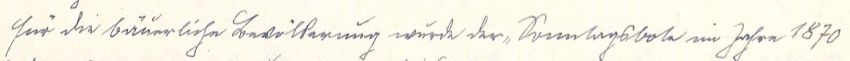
Für die bäuerliche Bevölkerung wurde der "Sonntagsbote" im Jahre 1870
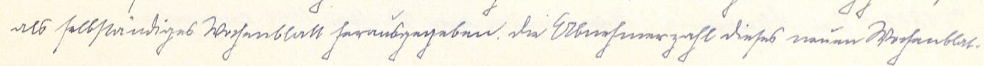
als selbstständiges Wochenblatt herausgegeben. Die Abnehmerzahl dieses neuen Wochenblat-
